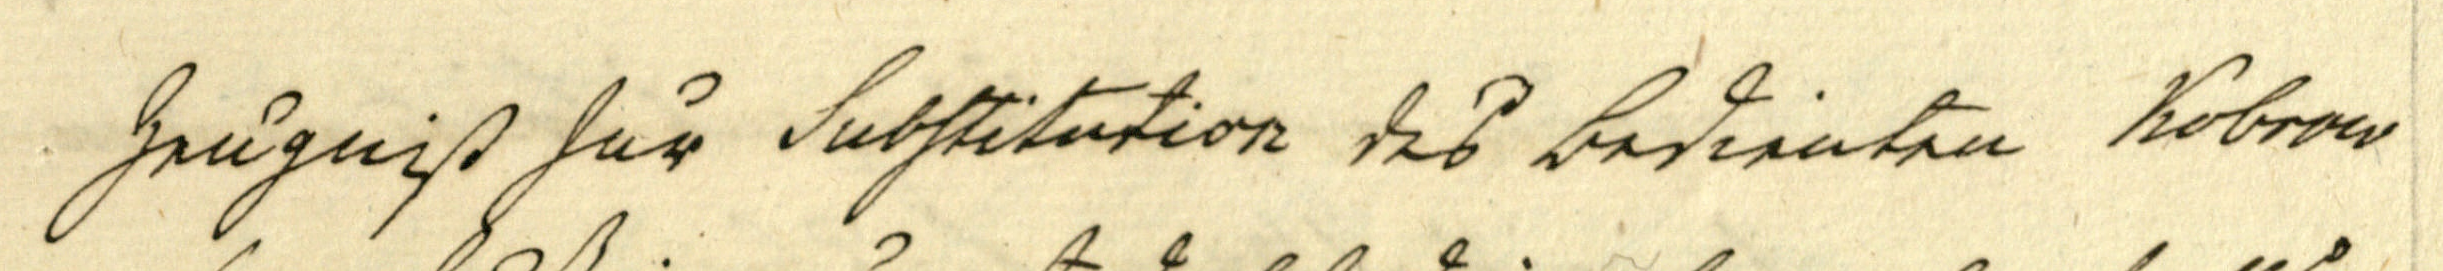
Zeugniß zur Substitution des Bedienten Kobrow
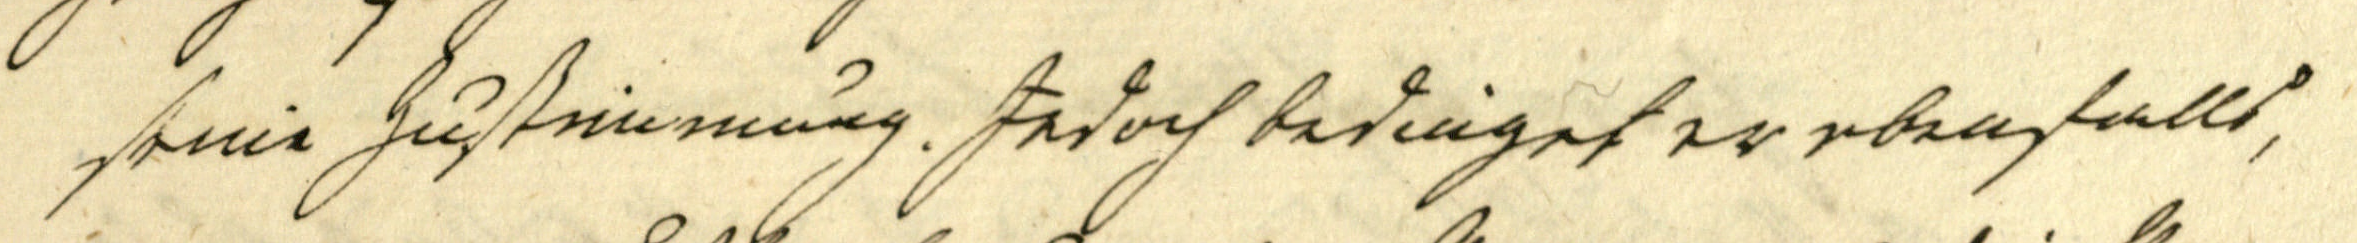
seine Zustimmung. Jedoch bedinget er ebenfalls,
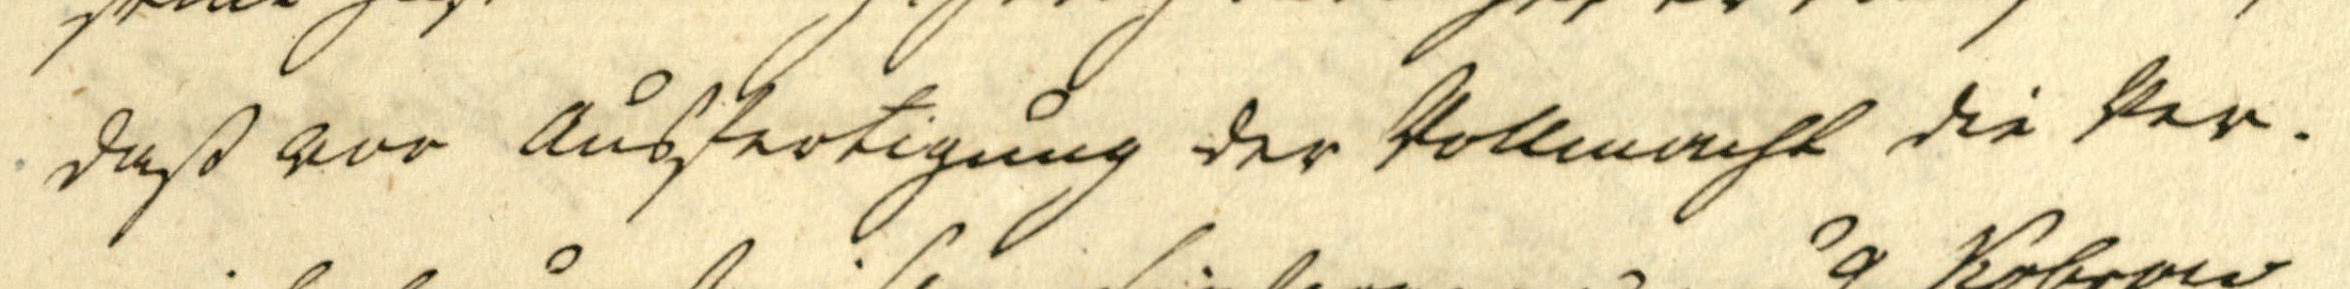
daß vor Ausfertigung der Vollmacht die Ver¬
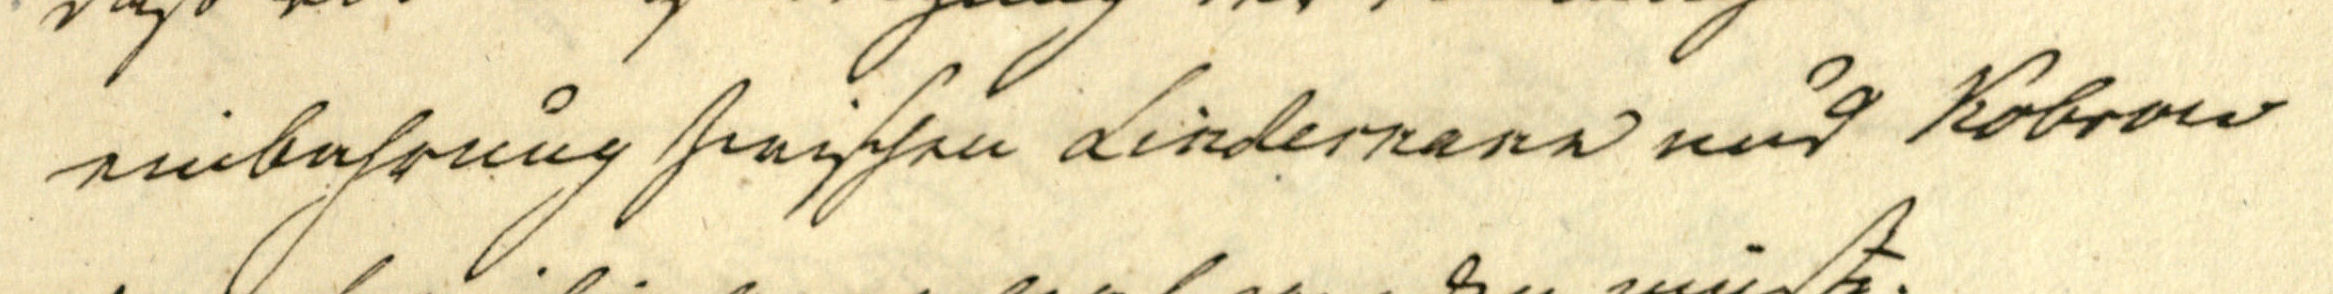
einbahrung zwischen Lindemann und Kobrow
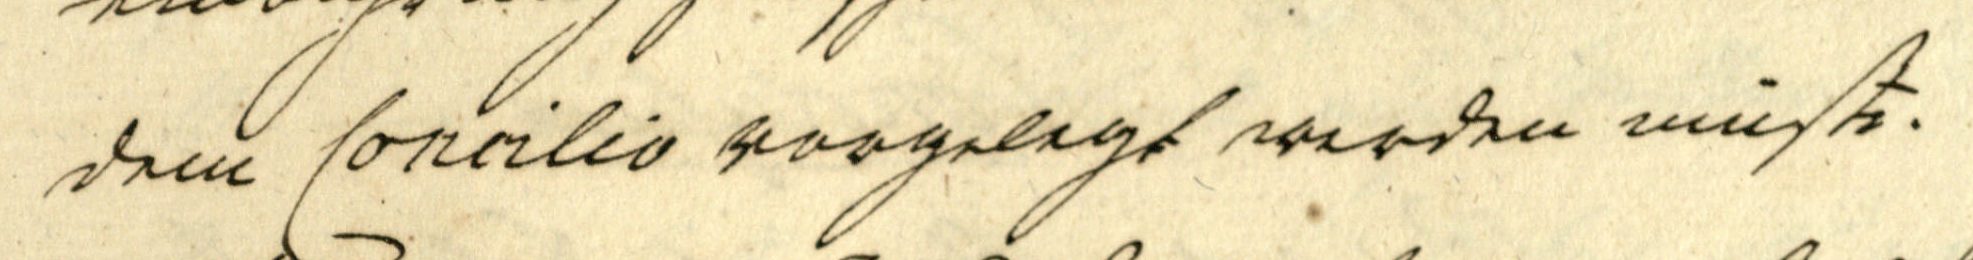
dem Concilio vorgelegt werden müßte.
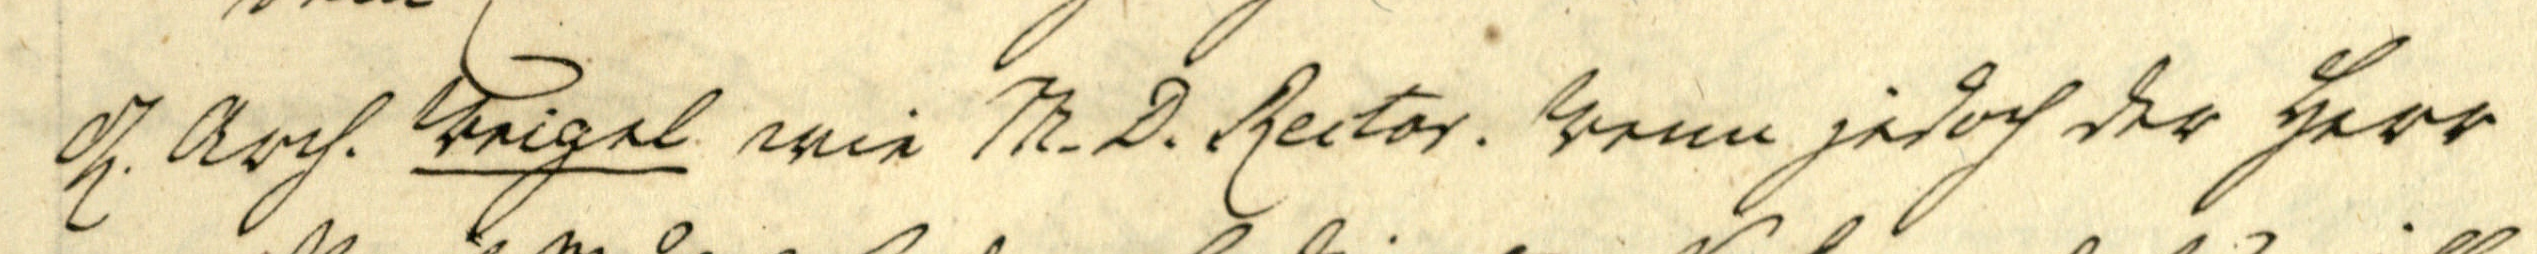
dh. Arch. Weigel, wie M. D. Rector. Wenn jedoch der Herr
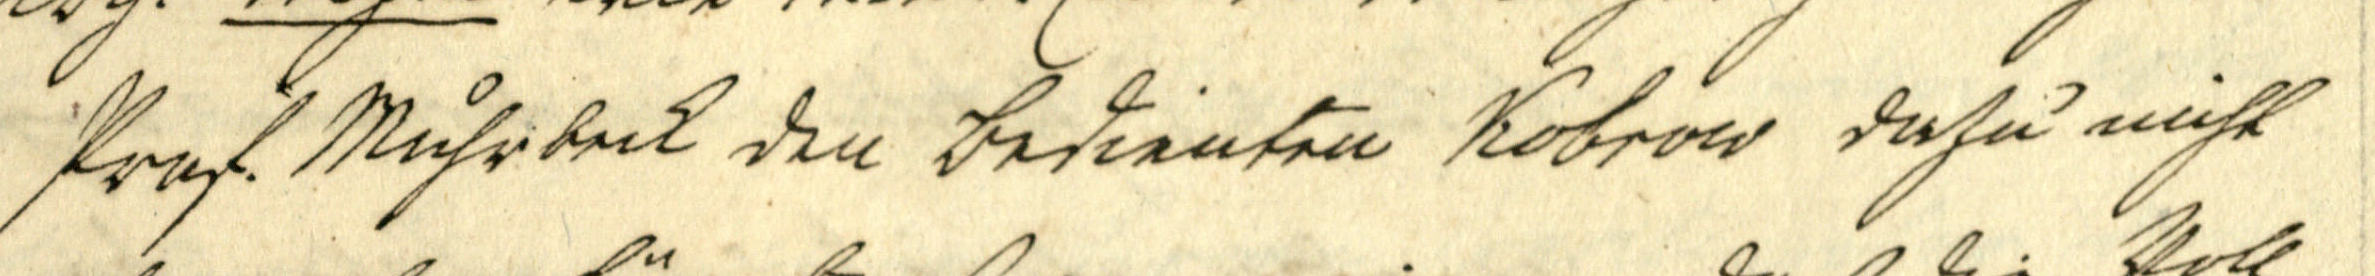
Prof. Muhrbeck den Bedienten Kobrow dazu nicht
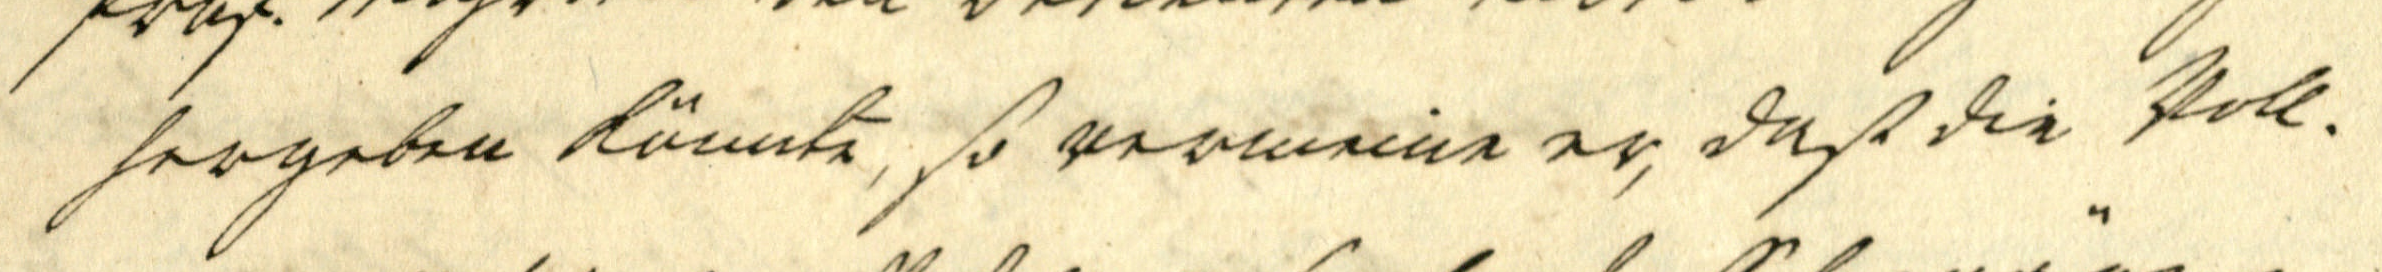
hergeben könnte, so vermeine er, daß die Voll¬
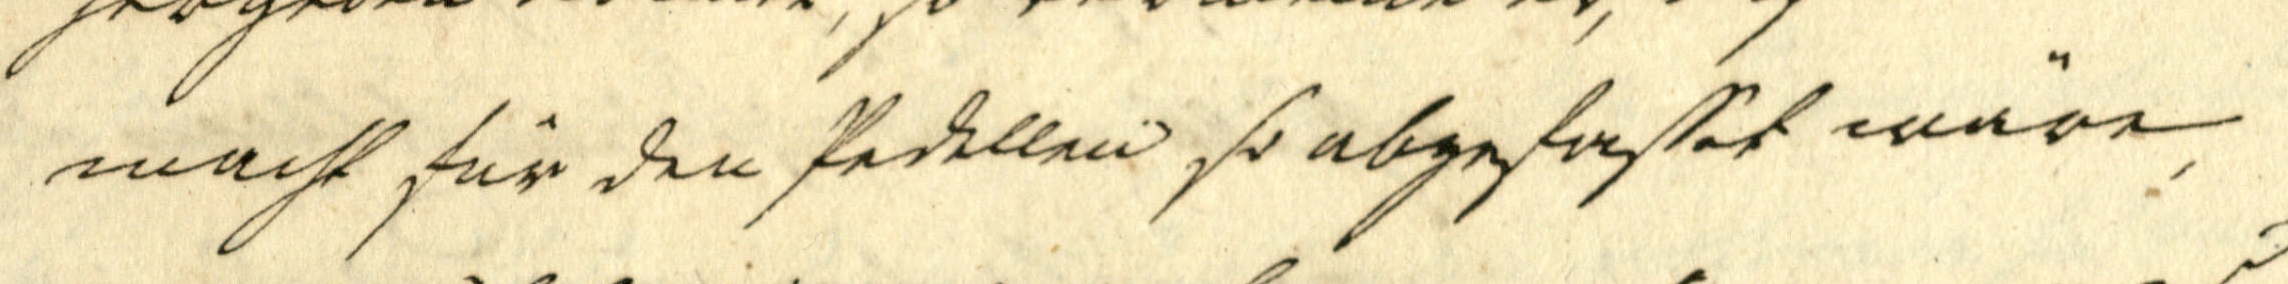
macht für den Pedellen so abgefasset wäre,
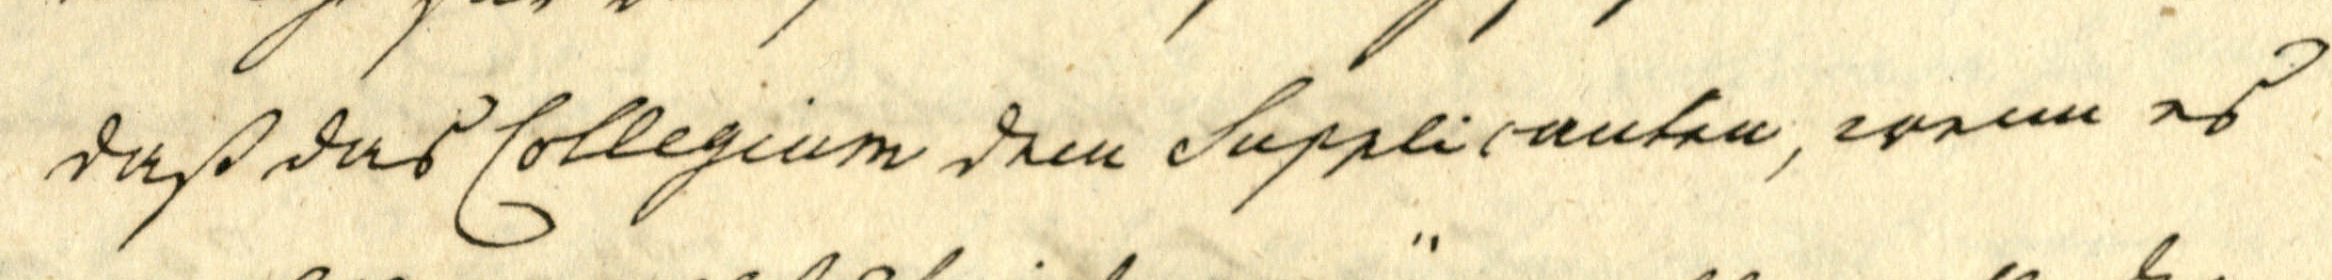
daß das Collegium dem Supplicanten, wenn es
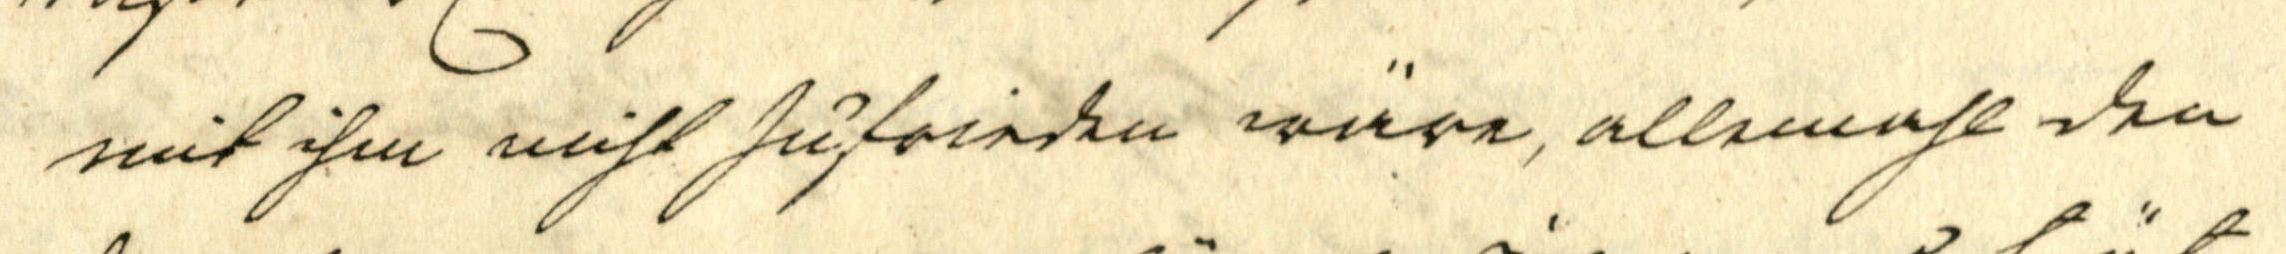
mit ihm nicht zufrieden wäre, allemahl den
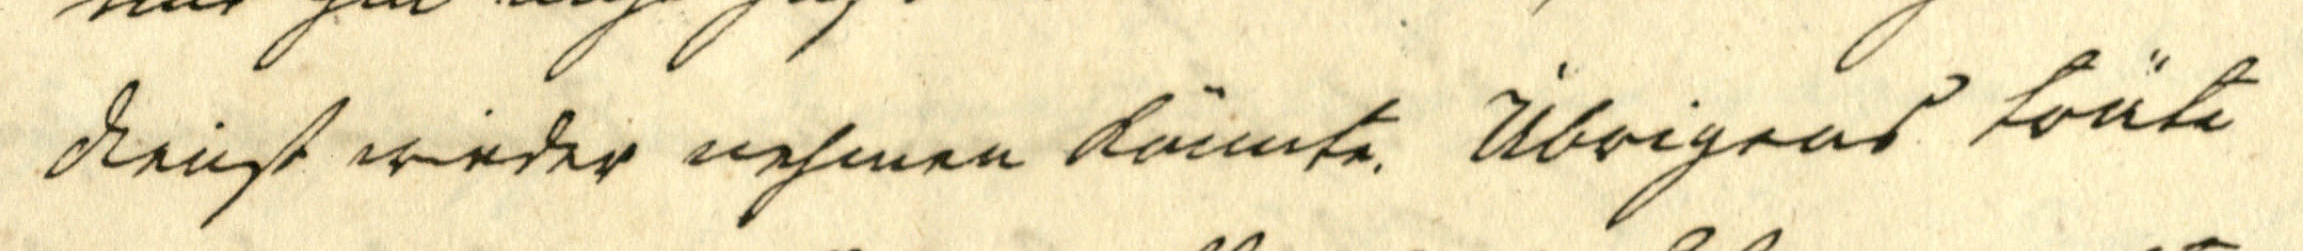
Dienst wieder nehmen könnte. Übrigens träte
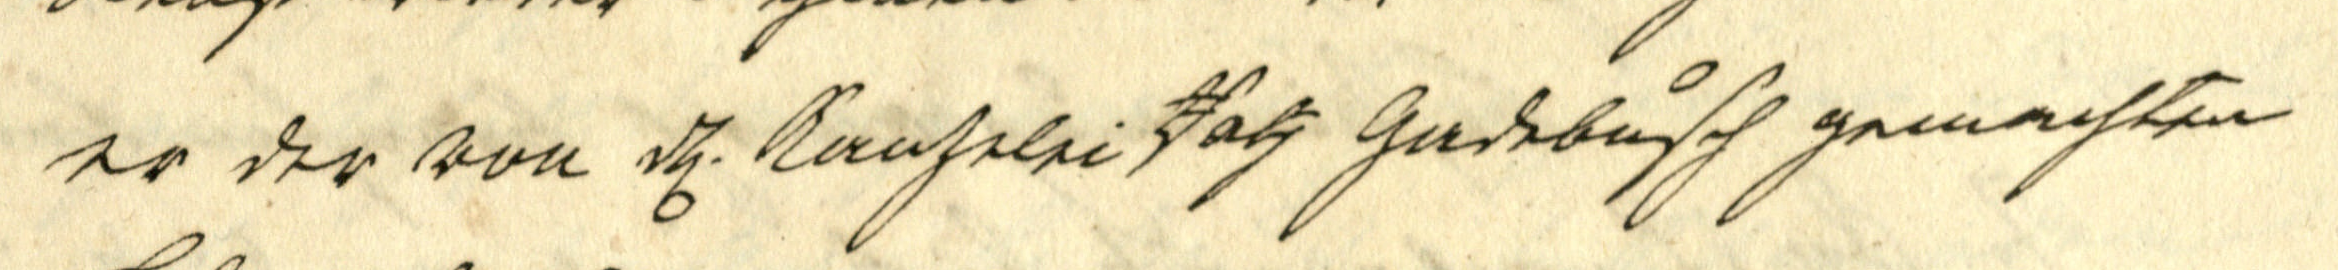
er der von dh. Kanzelei Rath Gadebusch gemachten
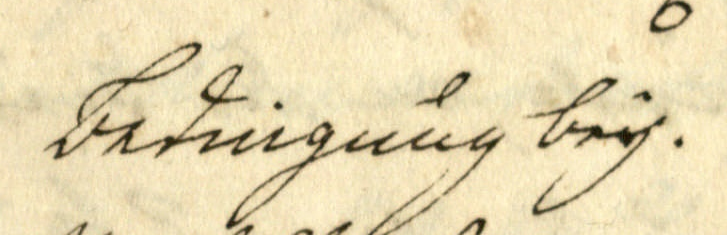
Bedingung beÿ.
